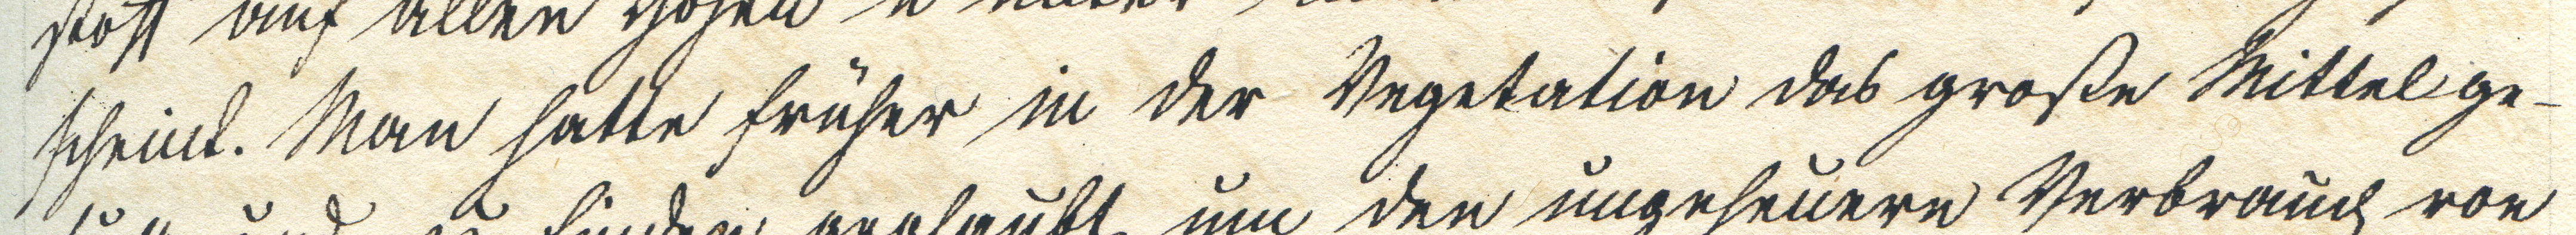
scheint. Man hatte früher in der Vegetation das große Mittel ge-
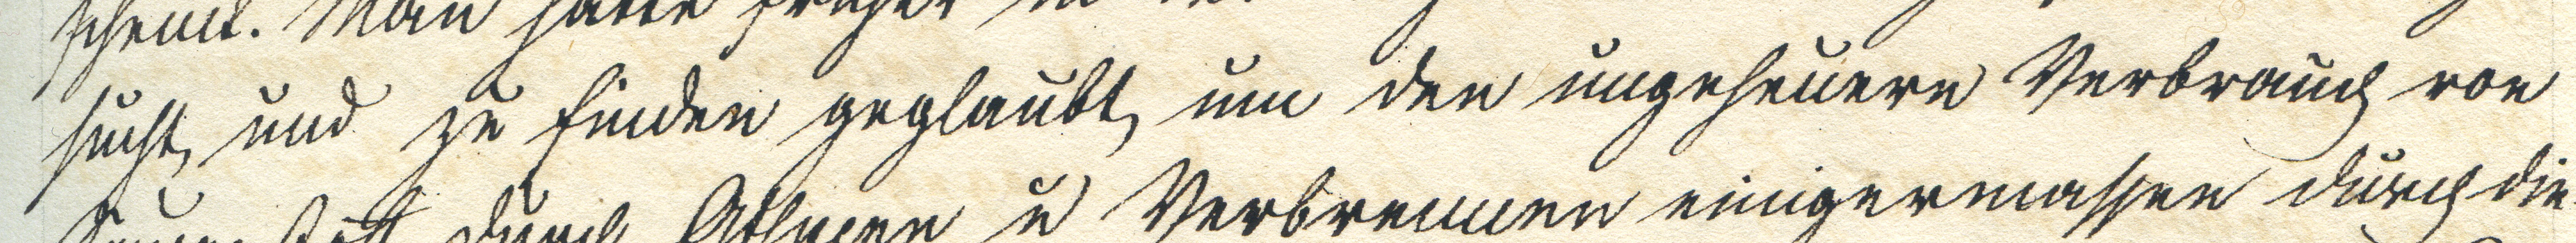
sucht, und zu finden geglaubt, um den ungeheuern Verbrauch von
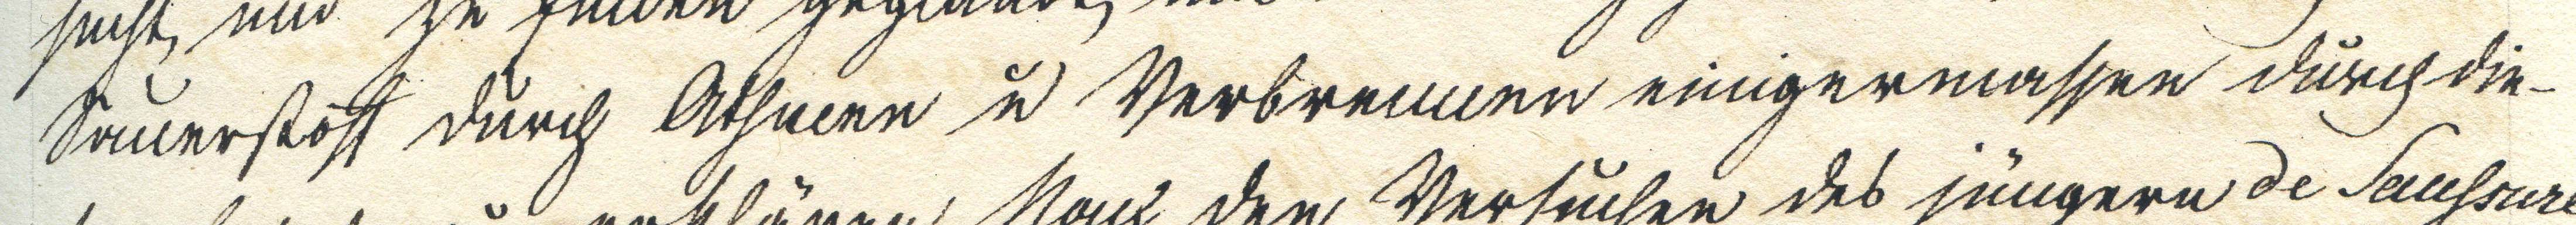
Sauerstoff durch Athmen u Verbrennen einigermassen durch die-
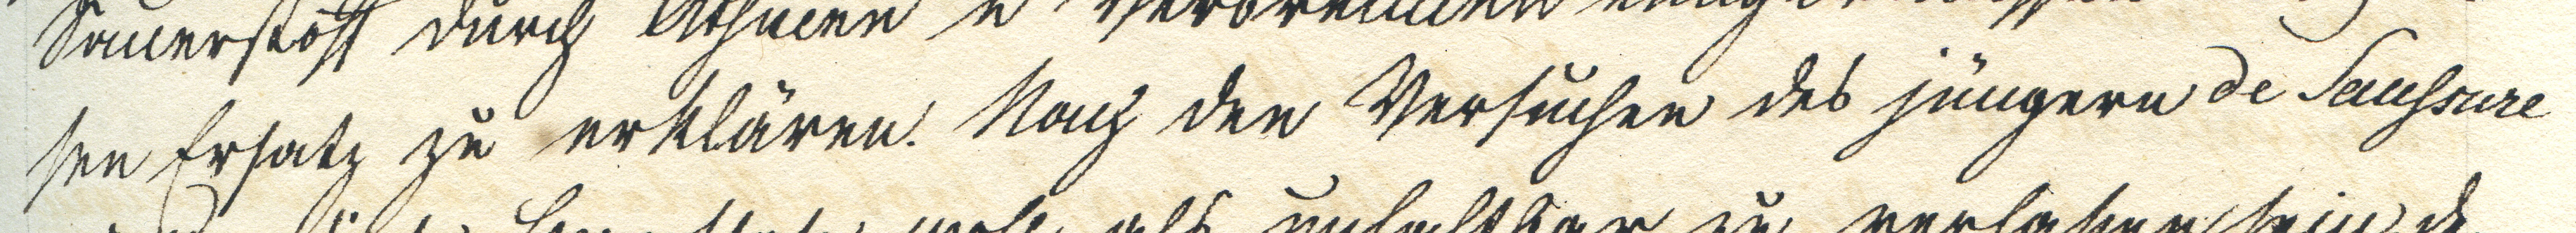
sen Ersatz zu erklären. Nach den Versuchen des jüngern de Saussure
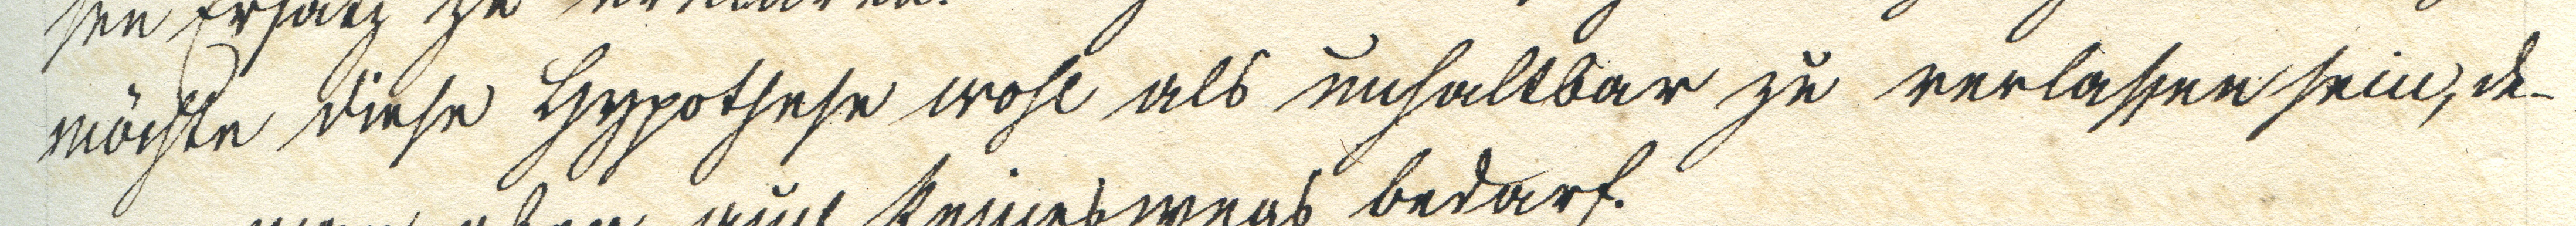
möchte diese Hypothese wohl als unhaltbar zu verlassen sein, de-
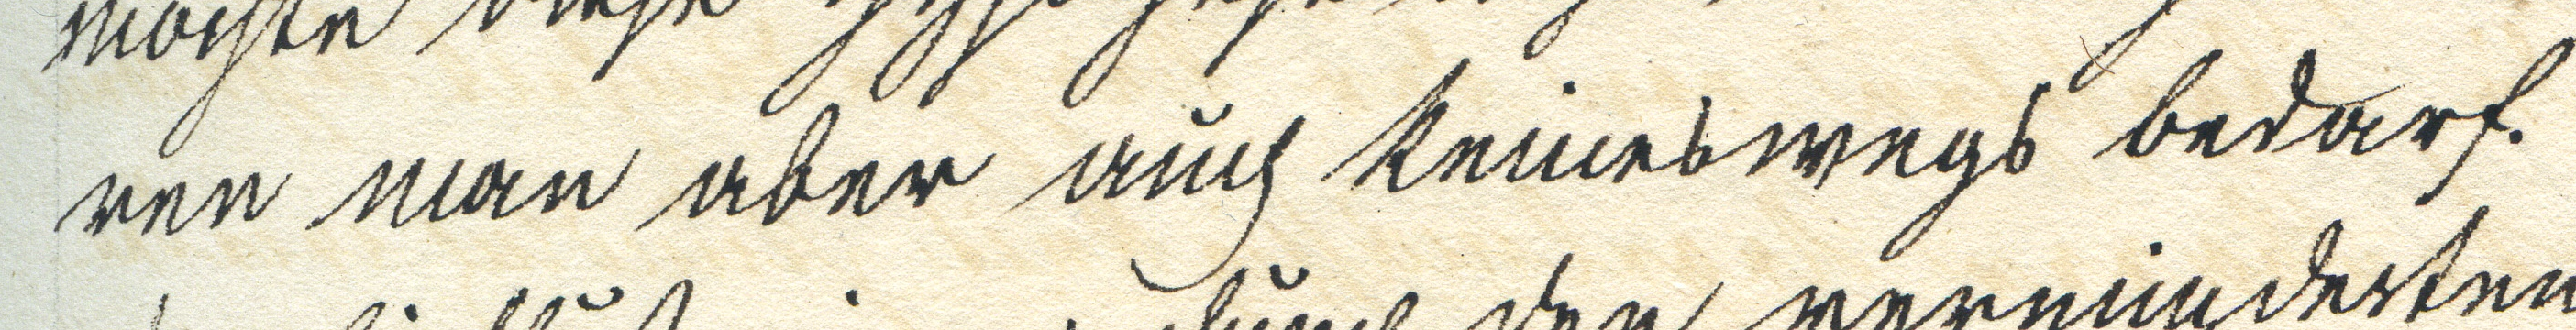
ren man aber auch keineswegs bedarf.
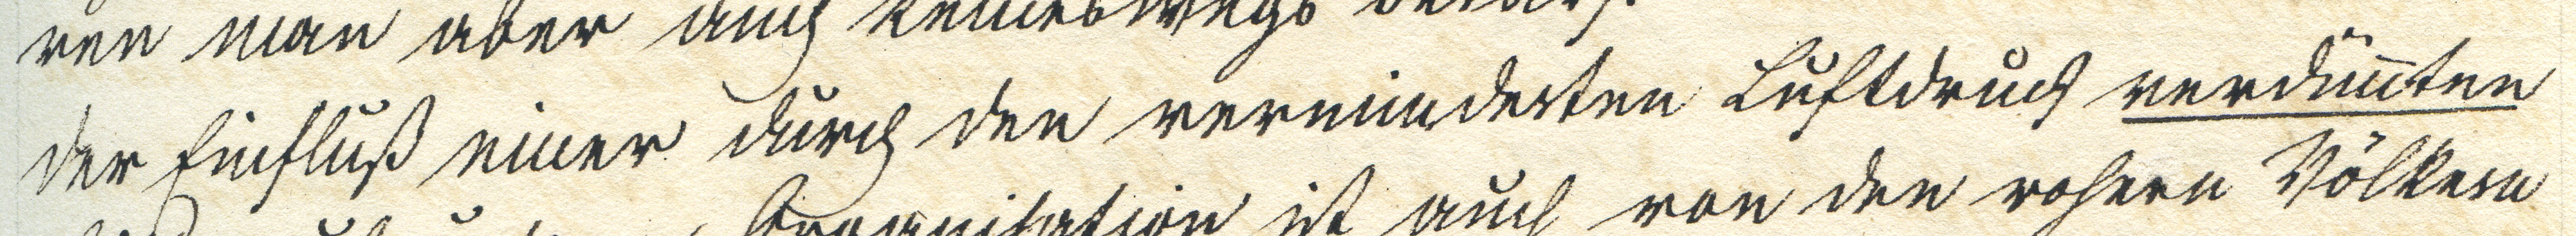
Der Einfluß einer durch den verminderten Luftdruck verdüñten
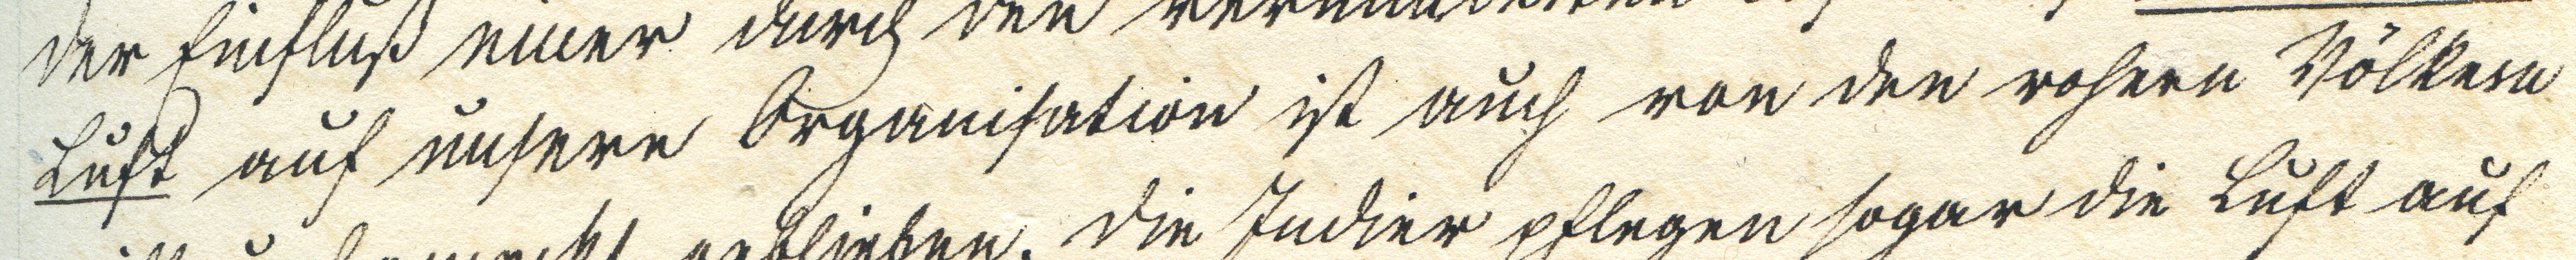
Luft auf unsere Organisation ist auch von den rohern Völkern
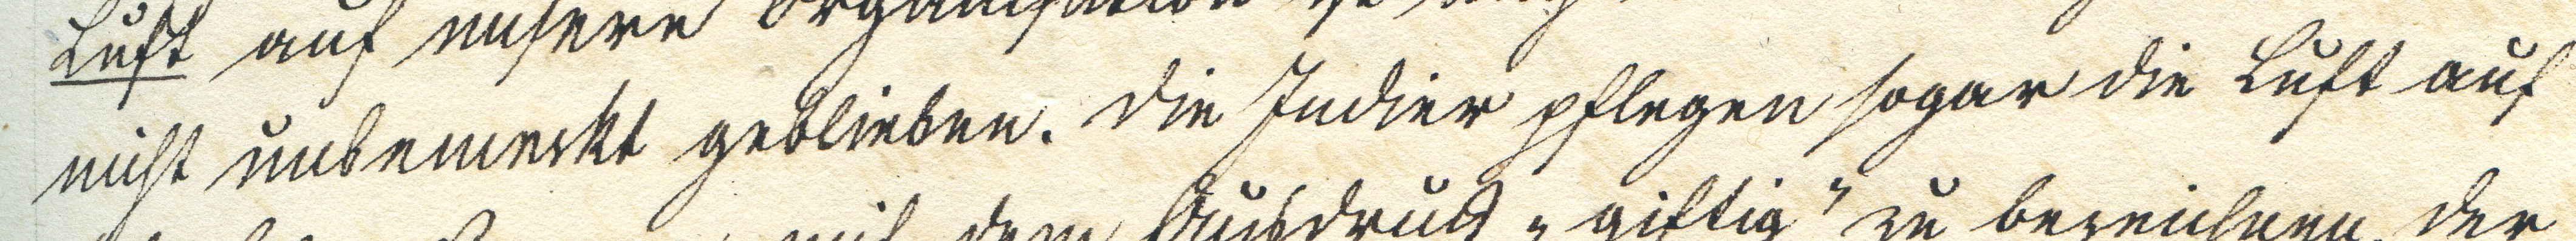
nicht unbemerkt geblieben. Die Indier pflegen sogar die Luft auf
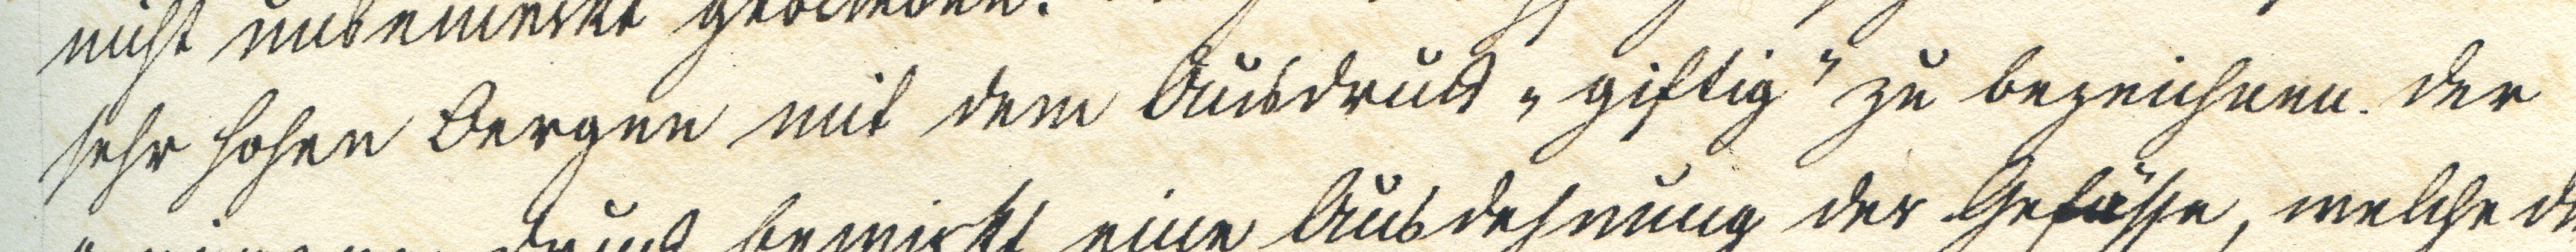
sehr hohen Bergen mit dem Ausdruck „giftig“ zu bezeichnen. Der
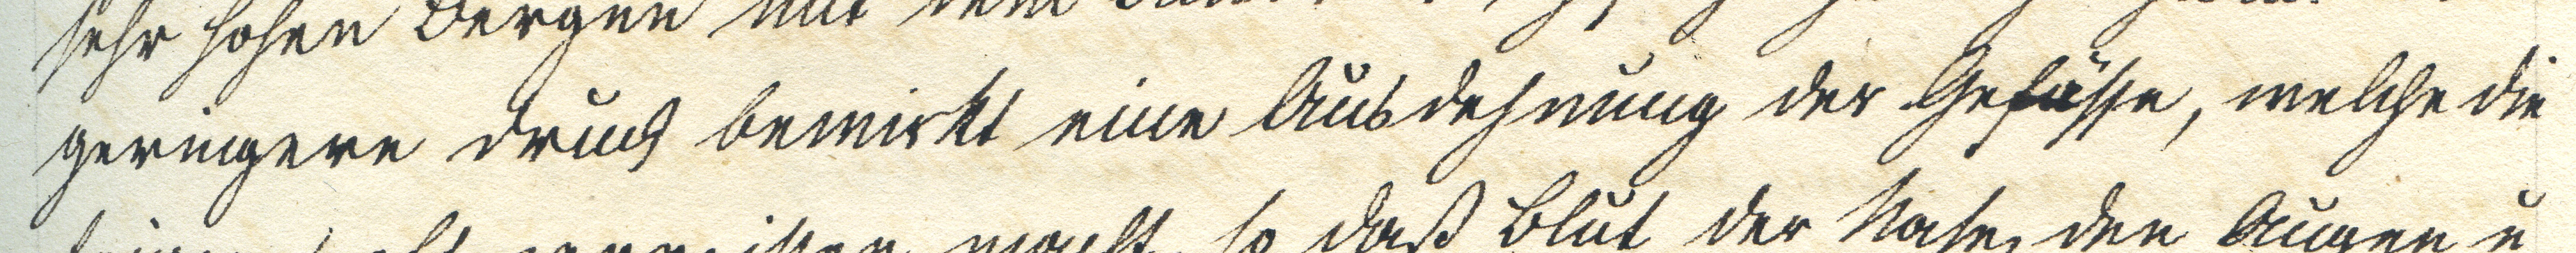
geringere Druck bewirkt eine Ausdehnung der Gefässe, welche die
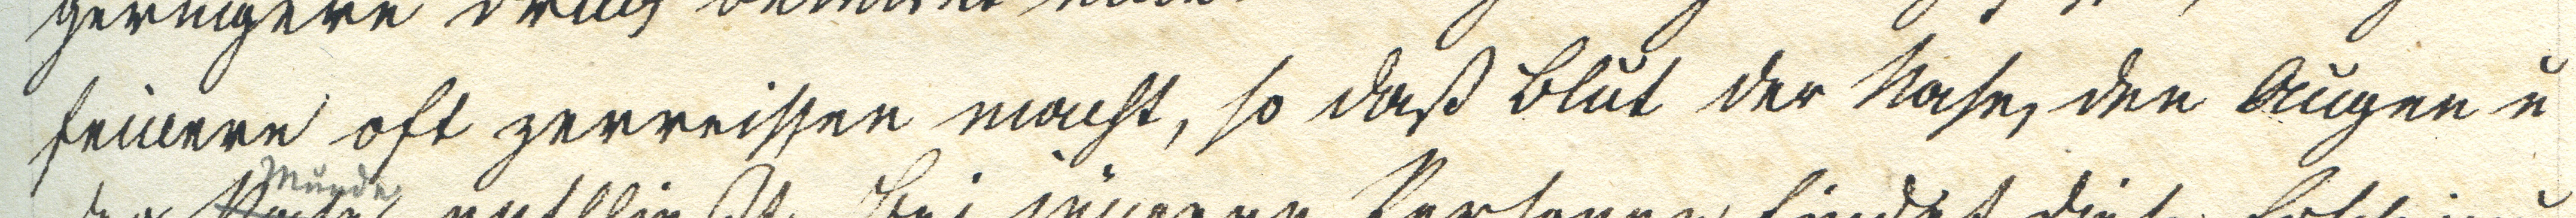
feinern oft zerreissen macht, so daß Blut der Nase, den Augen u
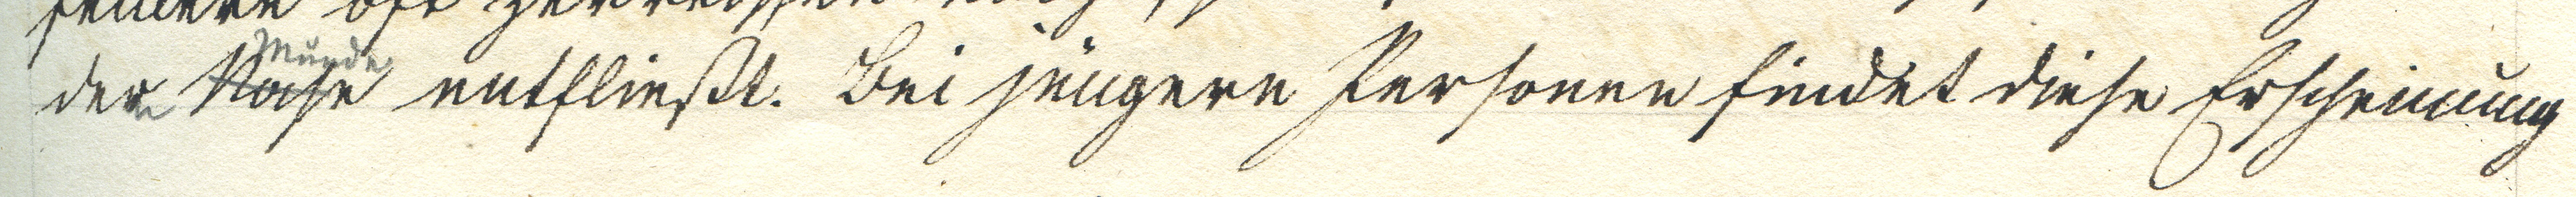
derm NaseMunde entfließt. Bei jüngern Personen findet diese Erscheinung
